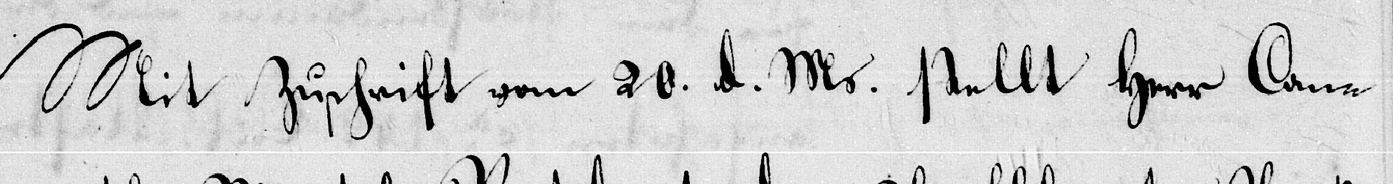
Mit Zuschrift vom 20. d. Ms. stellt Herr Can¬
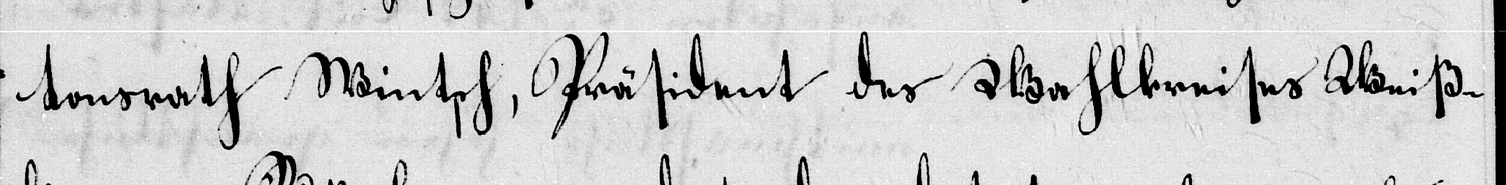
tonsrath Wintsch, Präsident des Wahlkreises Weiß¬
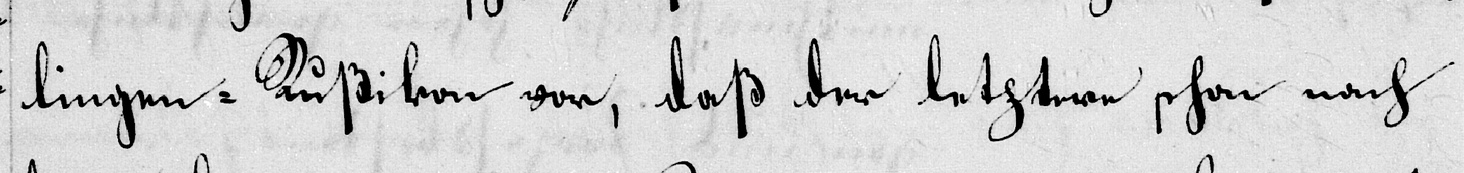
lingen-Rußikon vor, daß der letztere schon nach
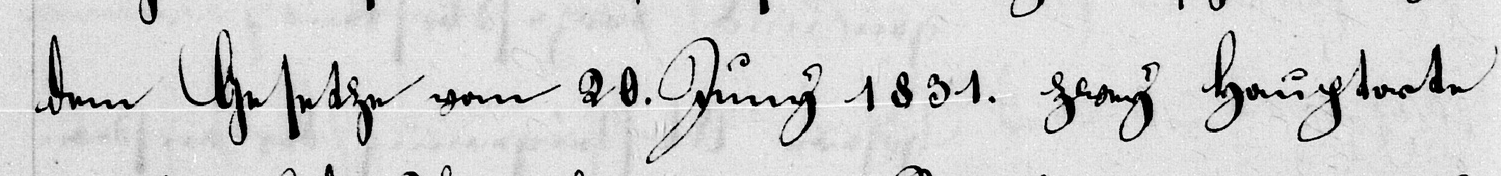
dem Gesetze vom 20. Juny 1831. zwey Hauptorte
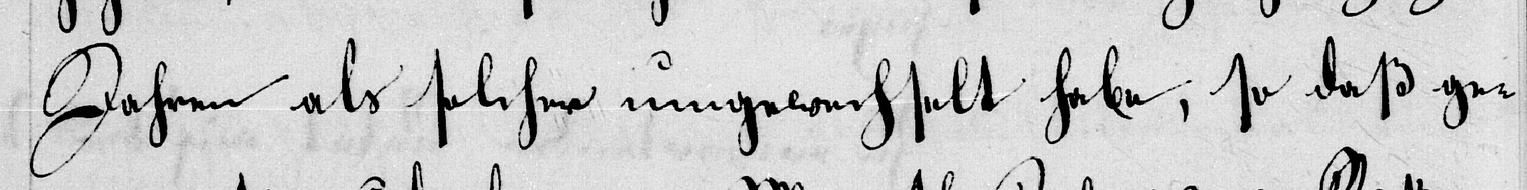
Jahren als solcher umgewechselt habe, so daß ge¬
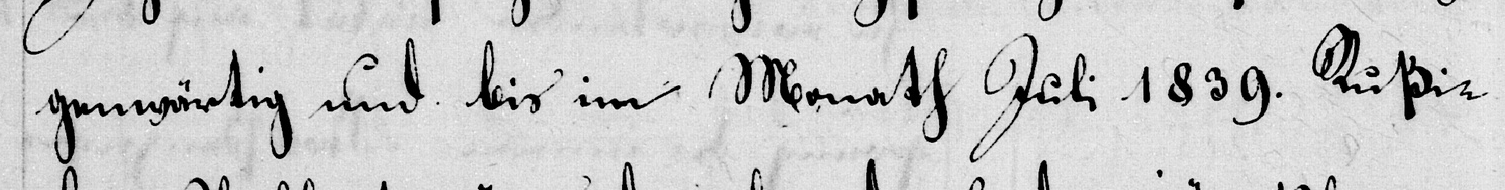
genwärtig und bis im Monath Juli 1839. Rußi¬
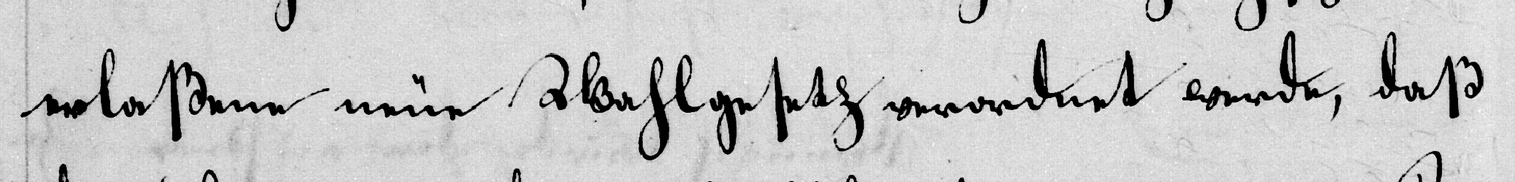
erlaßene neue Wahlgesetz verordnet werde, daß
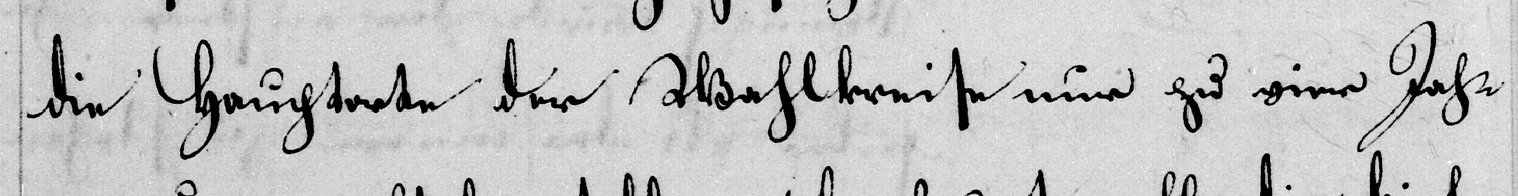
die Hauptorte der Wahlkreise nur zu vier Jah¬
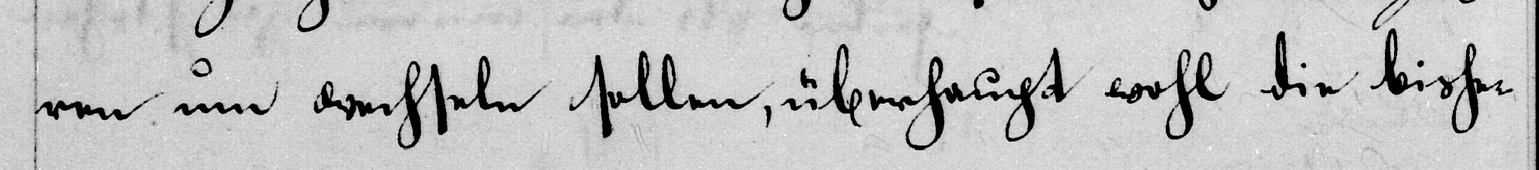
ren um wechseln sollen, überhaupt wohl die bishe-
